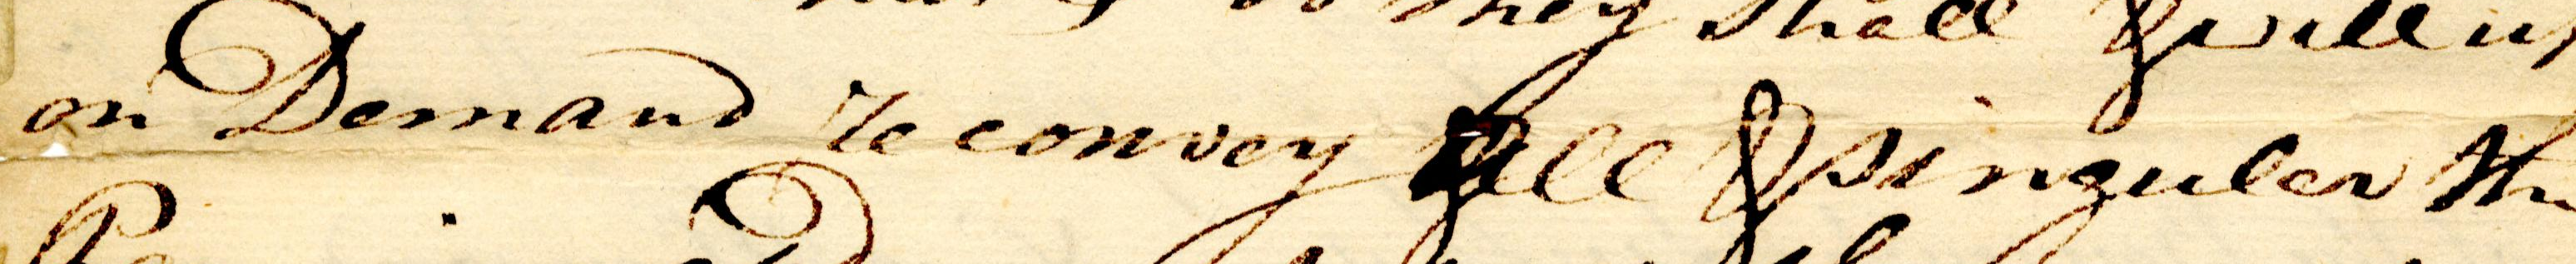on Demand reconvey all & singuler the
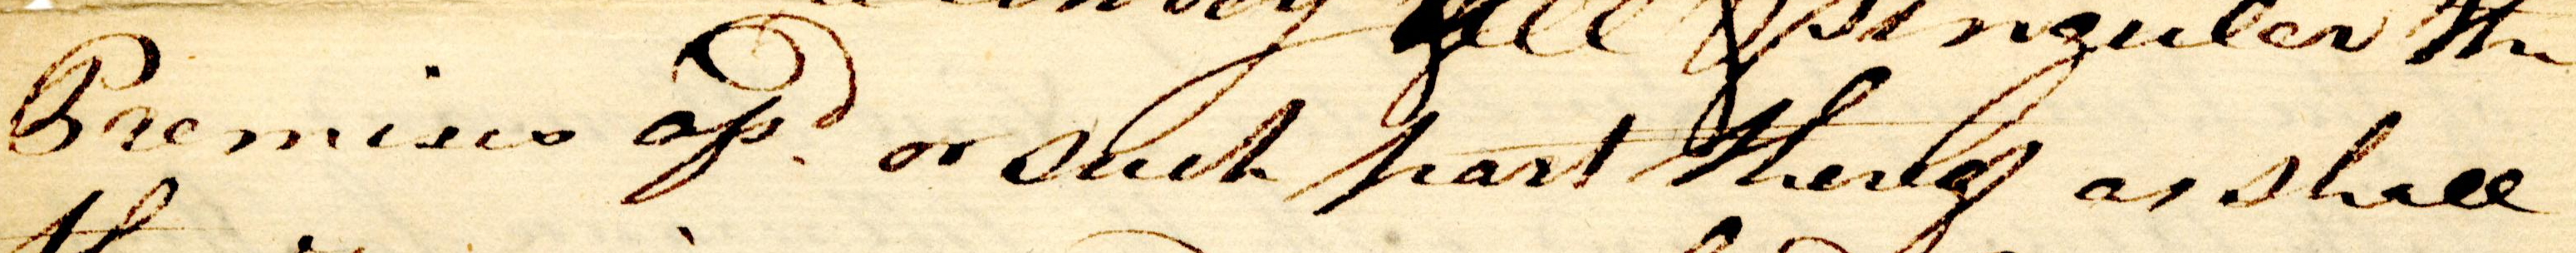Premises ass^d. or such part thereof as shall
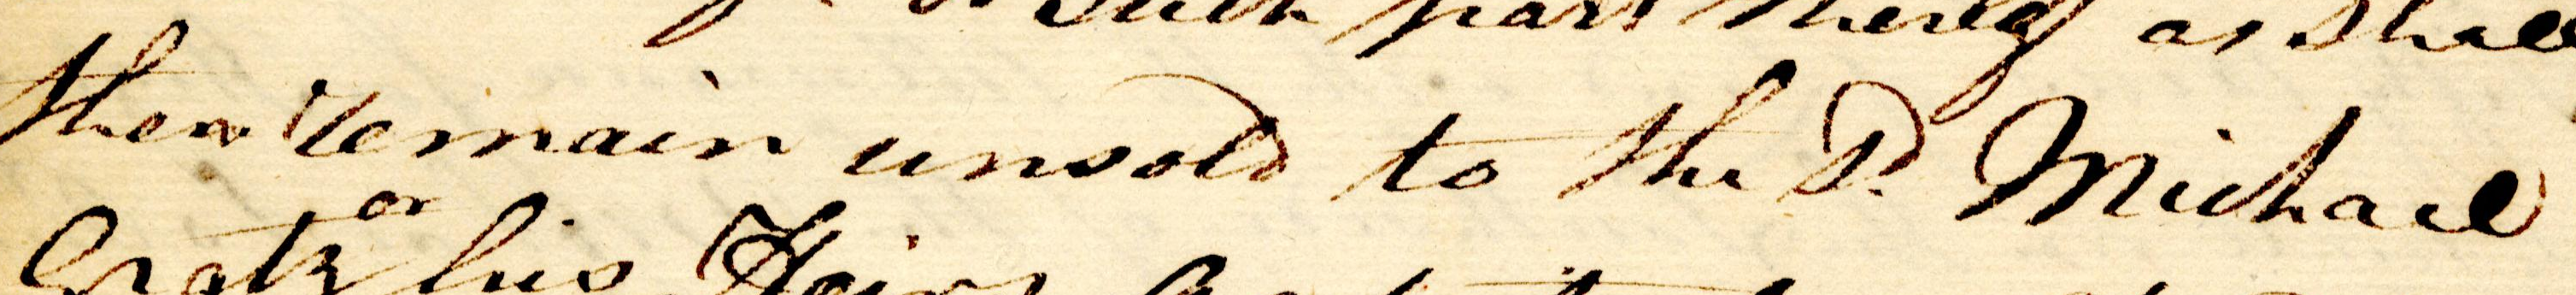then remain unsold to the s^d. Michael
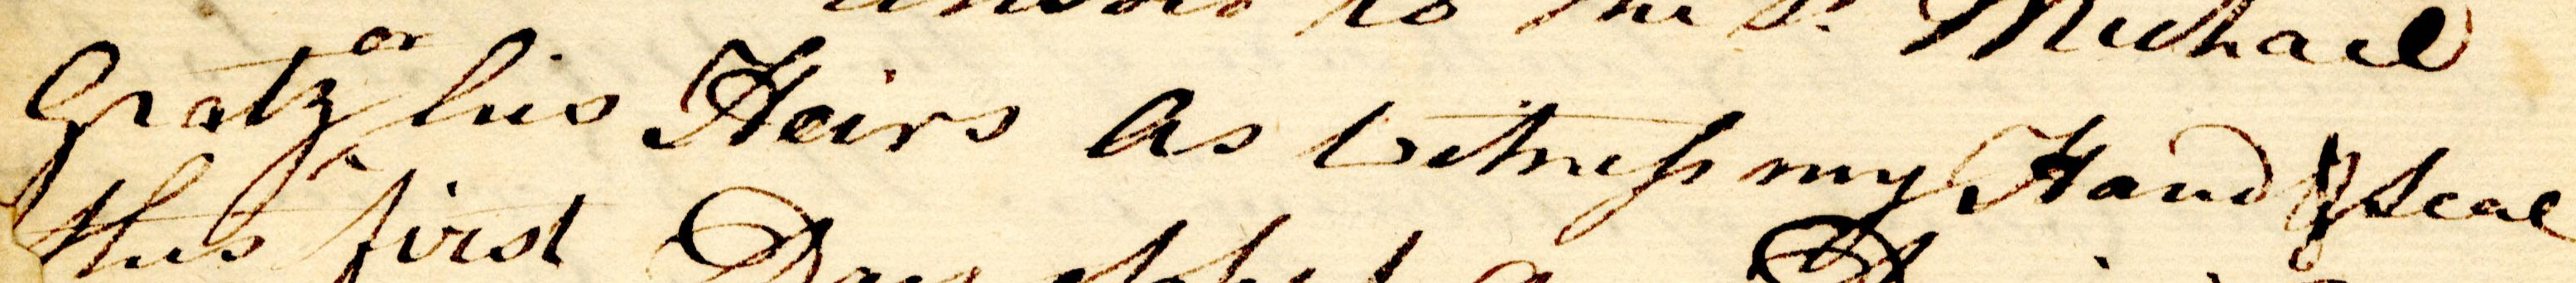Gratz ^or his Heirs as witness my Hand & seal
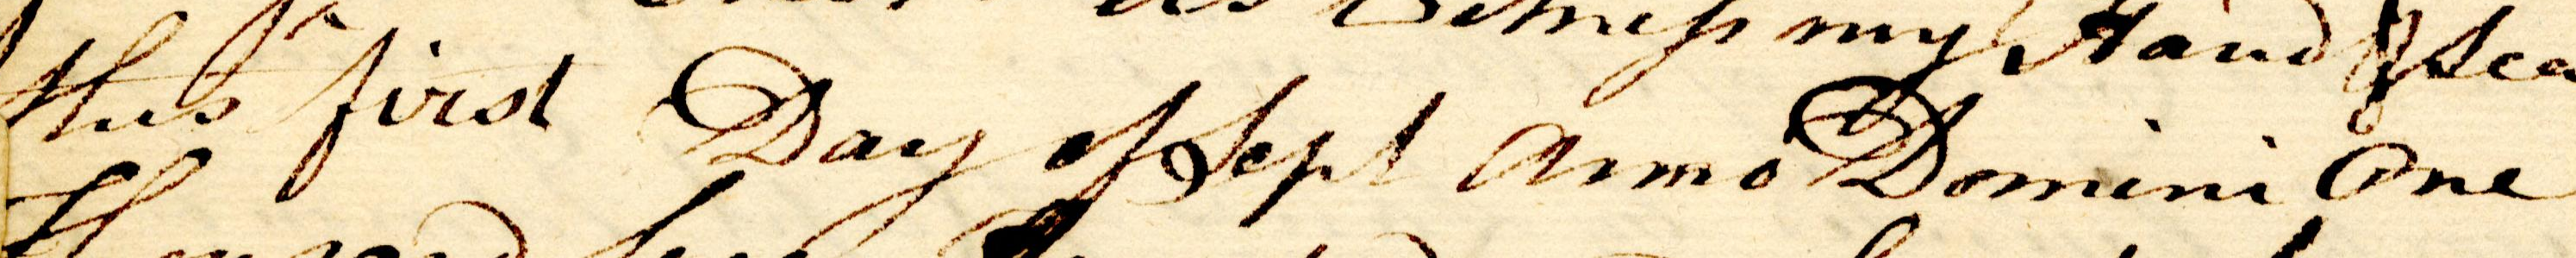this first Day of Sept^r anno Domini One
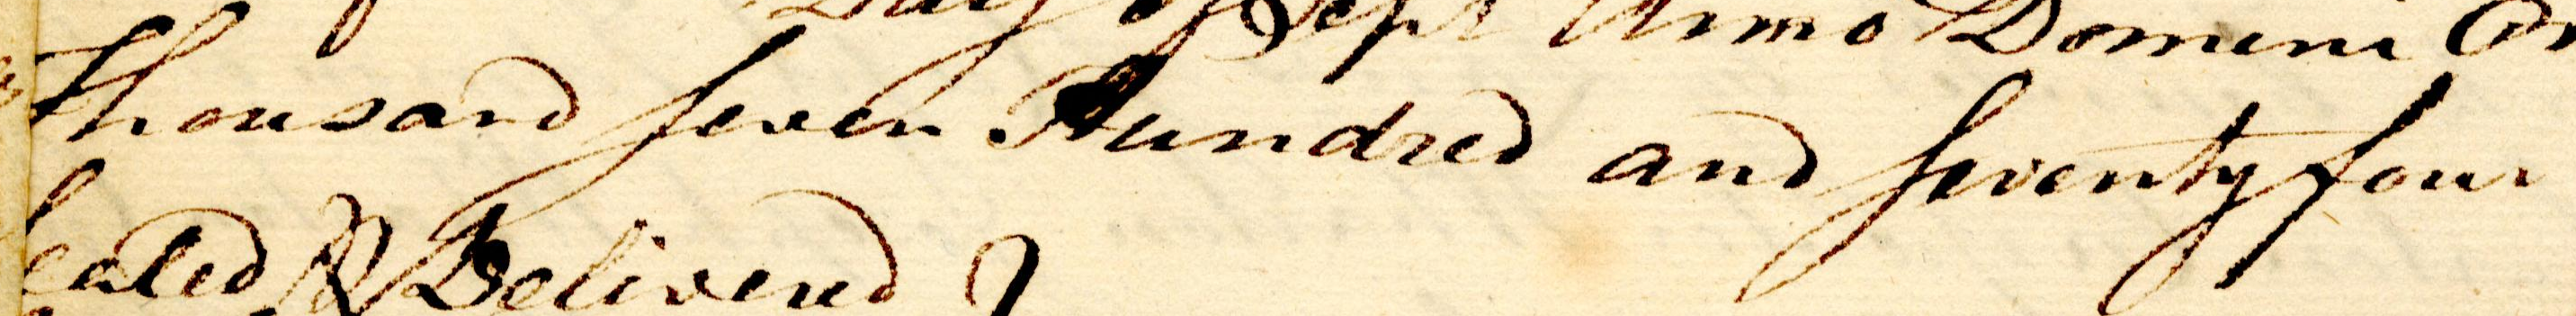Thousand Seven Hundred and seventy four
